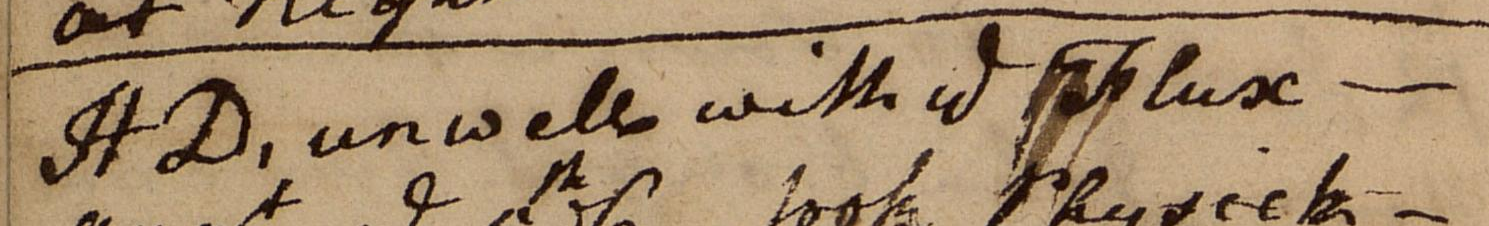HD. unwell with y^e Flux-
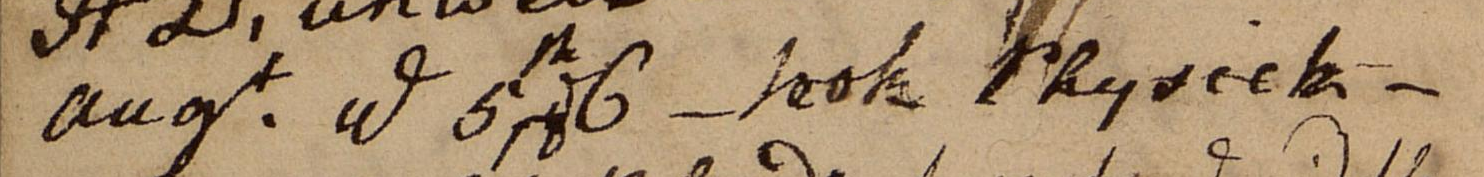Aug^t y^e 5^th & 6 - took Physick-
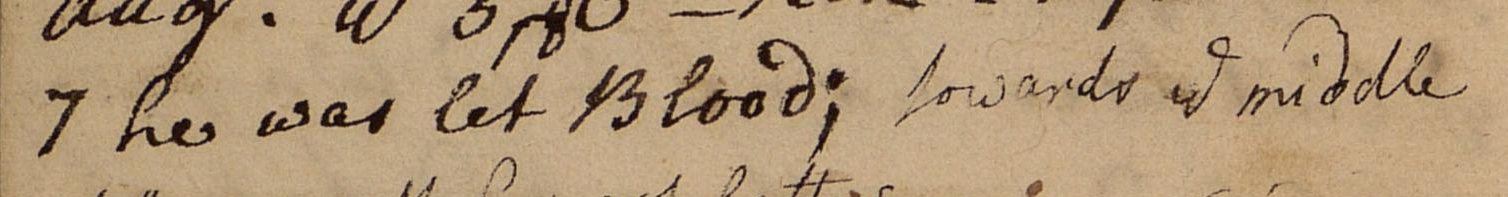7 he was let Blood; towards y^e middle
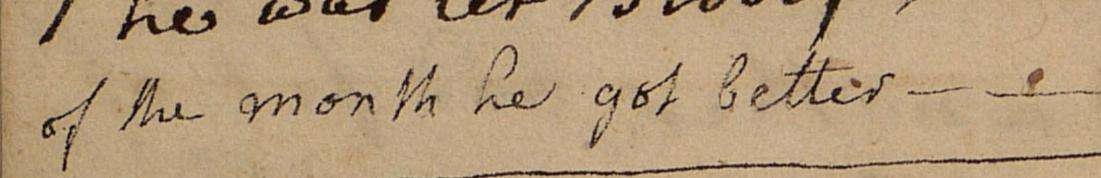of the month he got better-
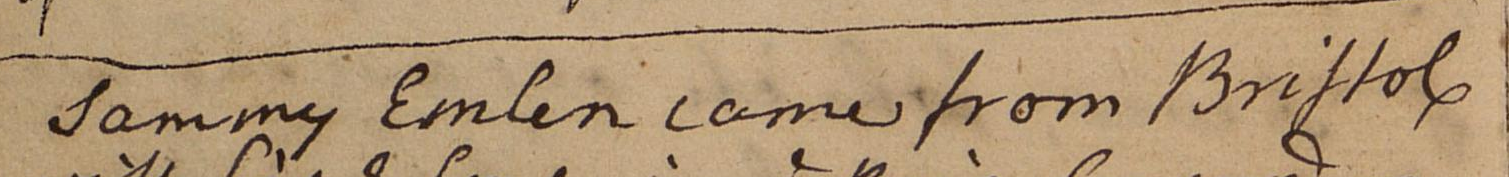Sammy Emlen came from Bristol
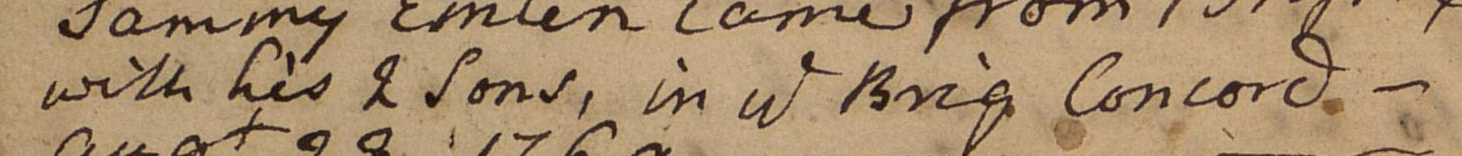with his 2 Sons, in y^e Brig Concord.-
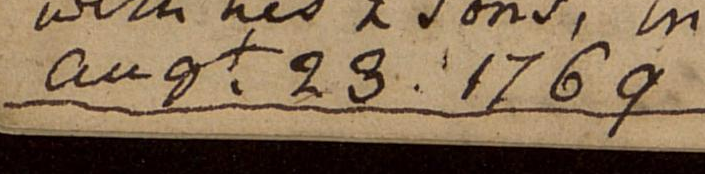Aug^t 23. 1769
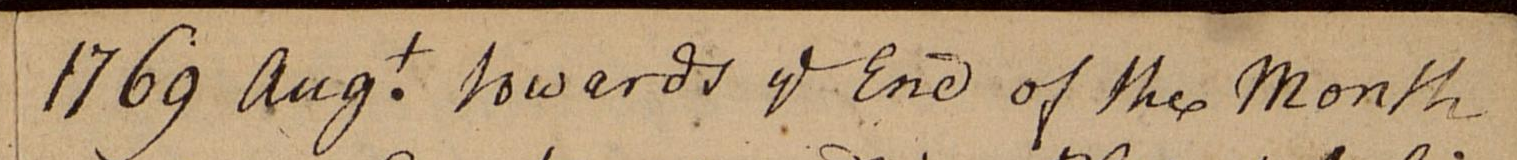1769 Aug^t. towards y^e End of the Month
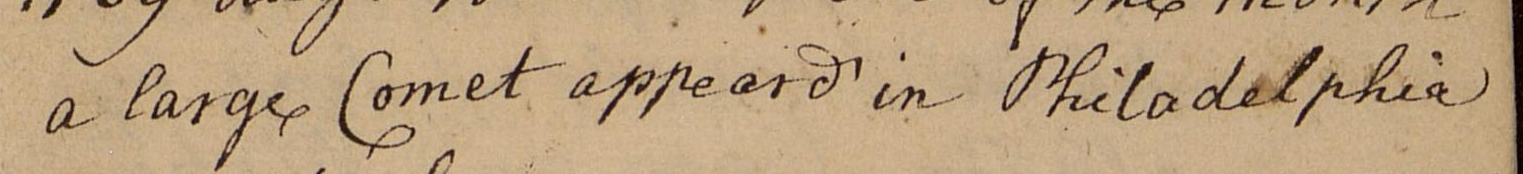a large Comet appeard in Philadelphia
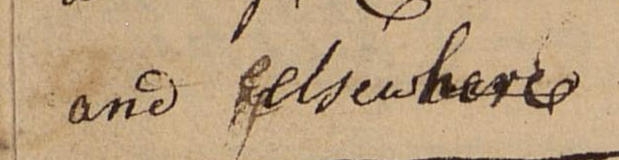and Elsewhere
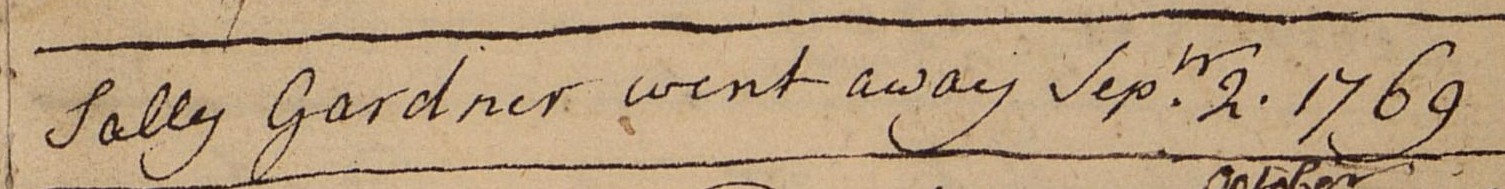Sally Gardner went away Sep^tr. 2. 1769
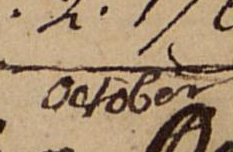October
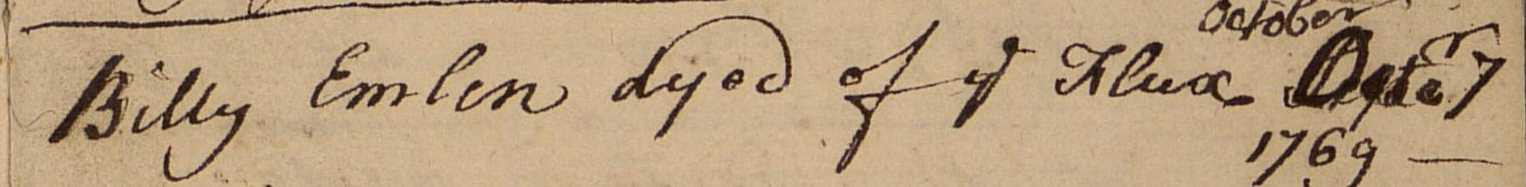Billy Emlen dyed of y^e Flux Oct^r 7
